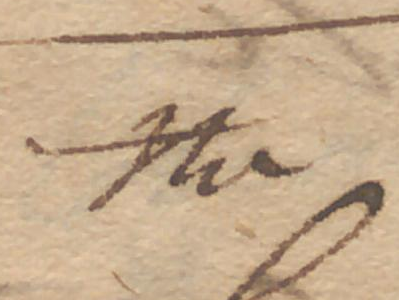the
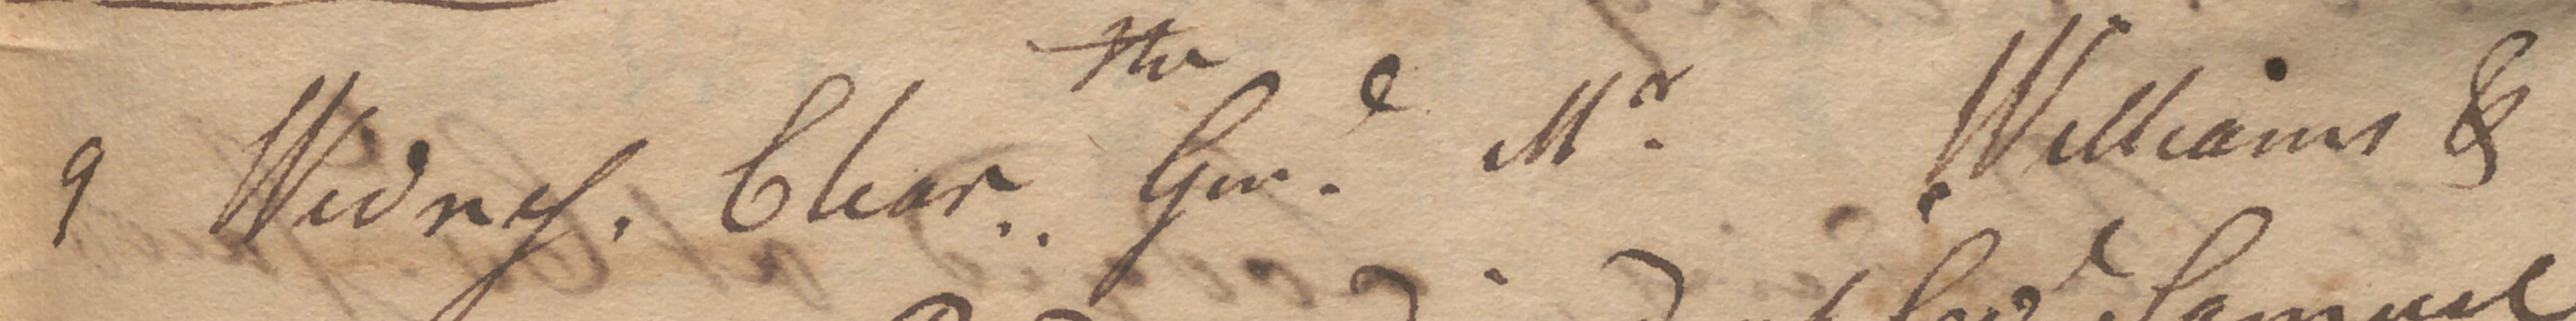9 Wednes. Clear Gen^l. M^r. Williams &
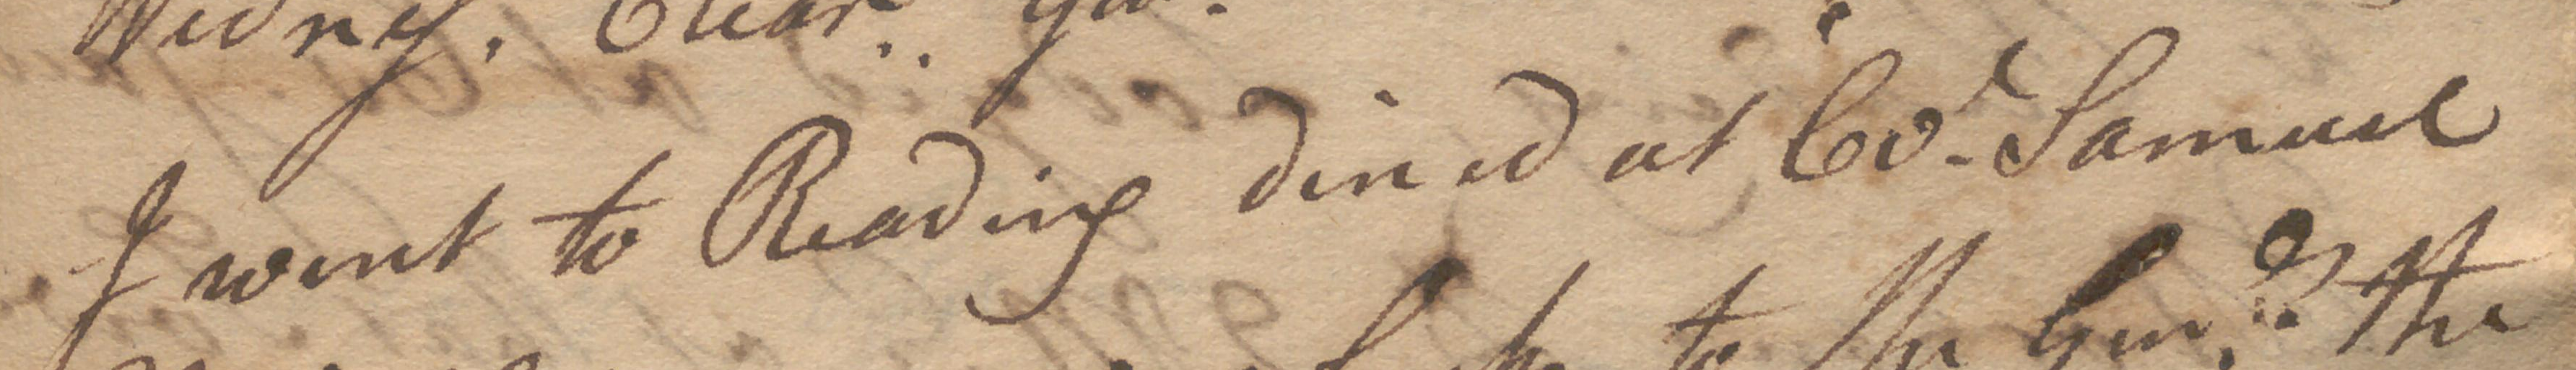I went to Reading dined at Co^l. Samuel
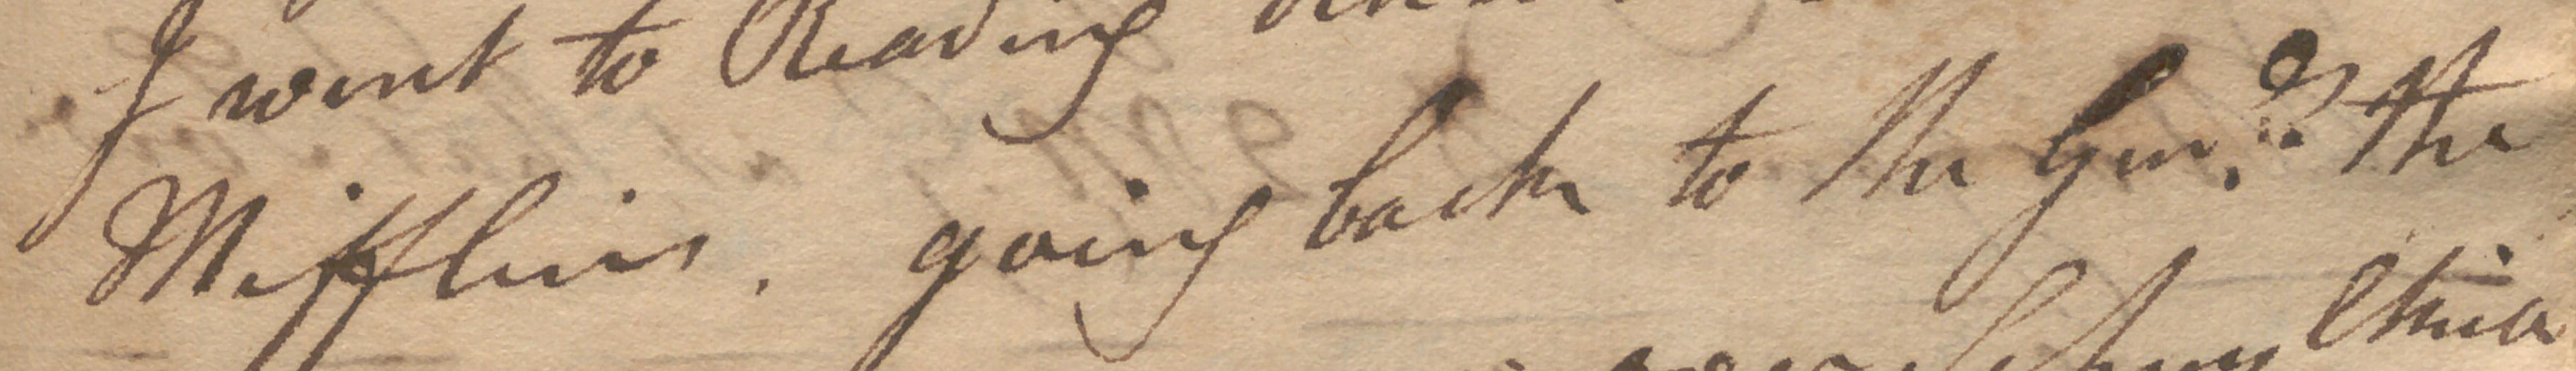Mifflins, going back to the Gen^ls. the
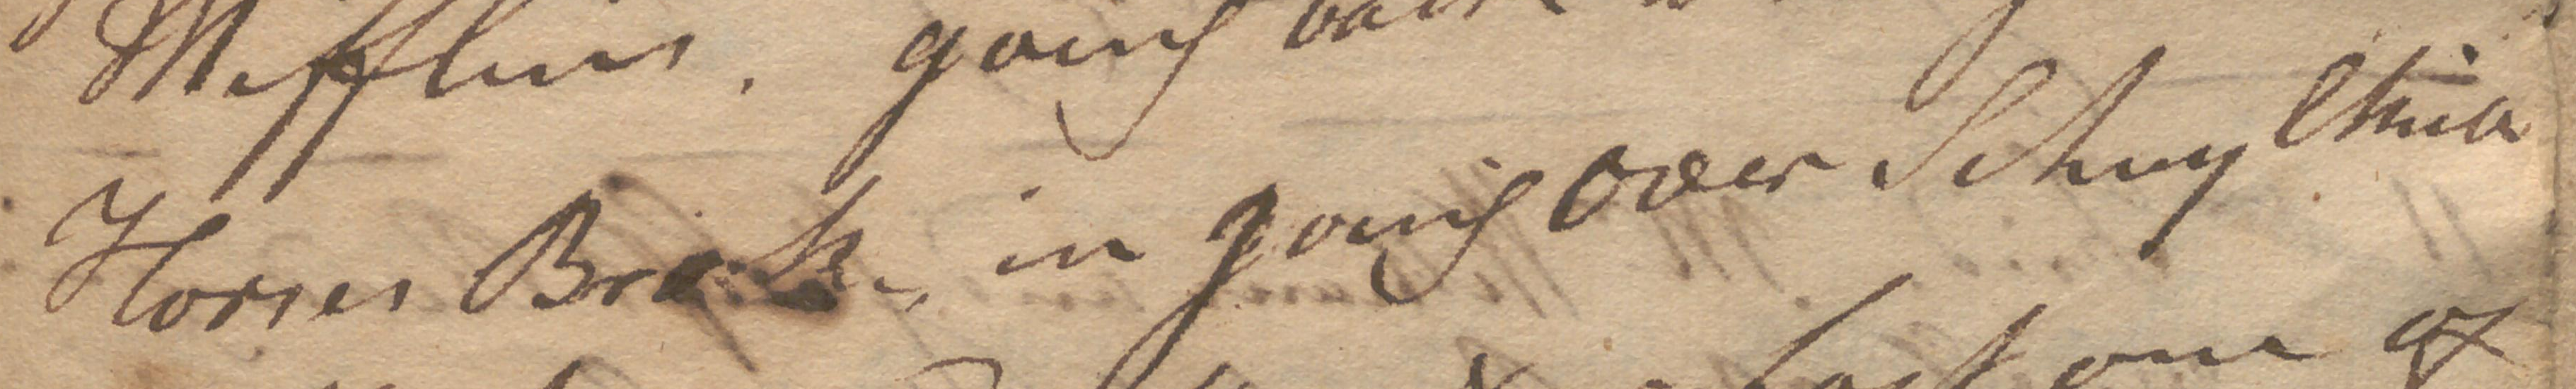Horses Broke in going over Schuylkill
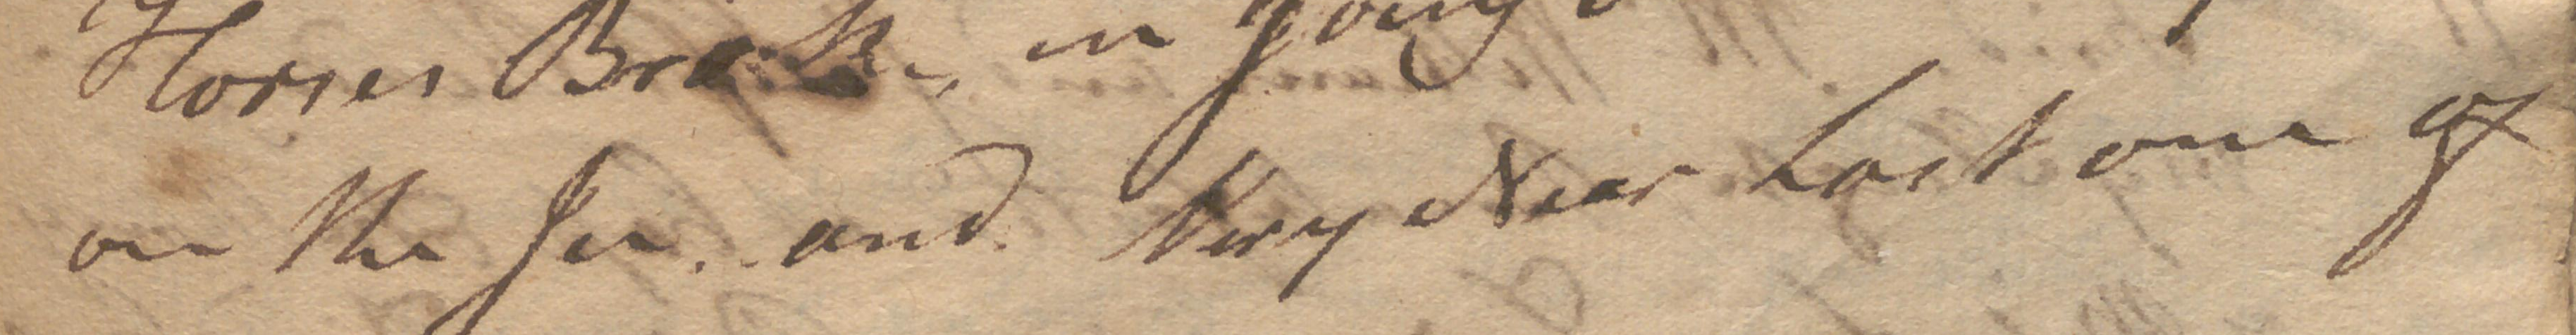on the Ice and very Near Lost one of
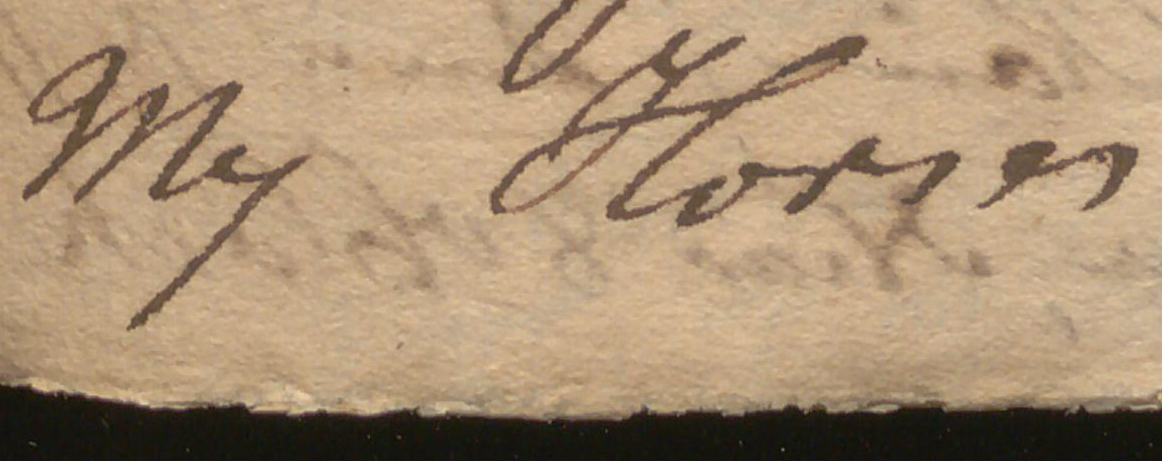My Horses
